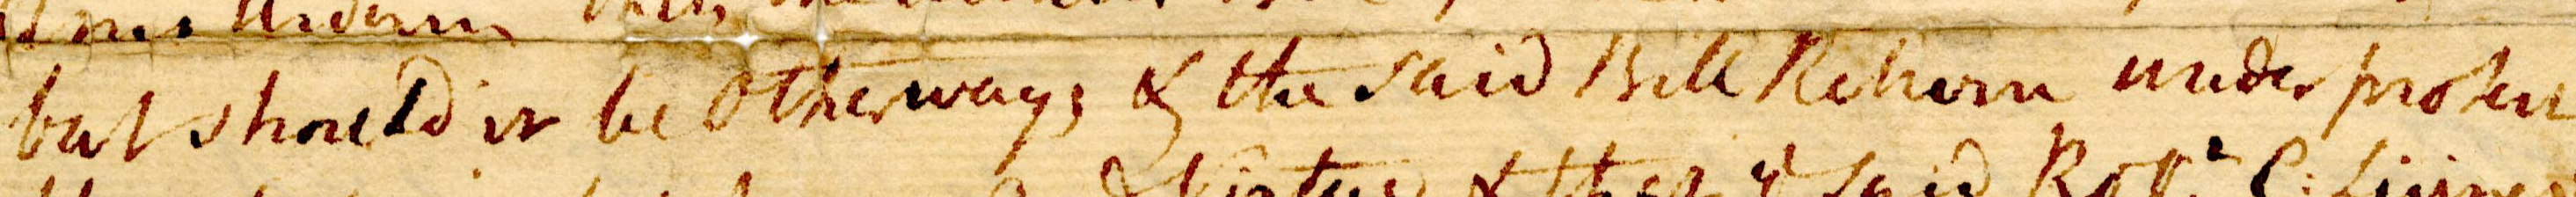but should in be the way, & the said Bill Return, made protect
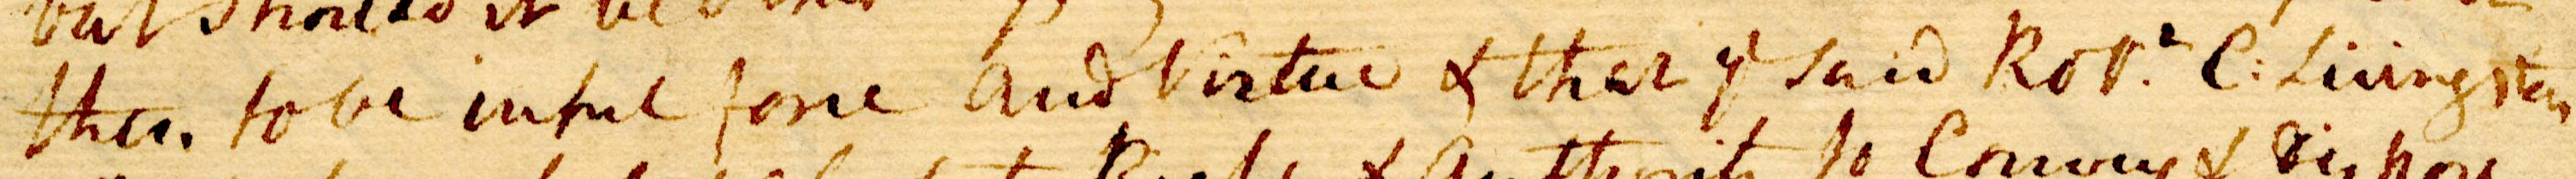ther to be in ful force and Virtue of that y^e said Rob^t. C. Livingston
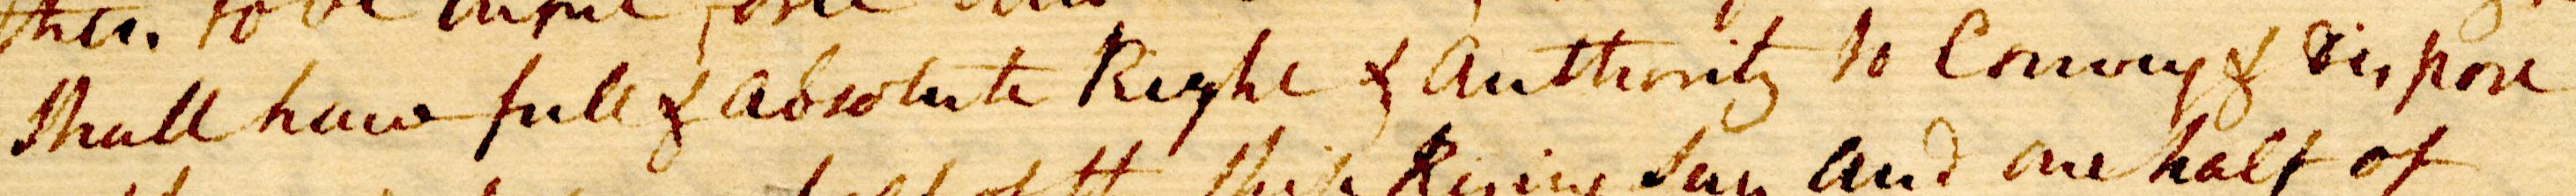shall have full & absolute Right & Authority to Convey & dispose
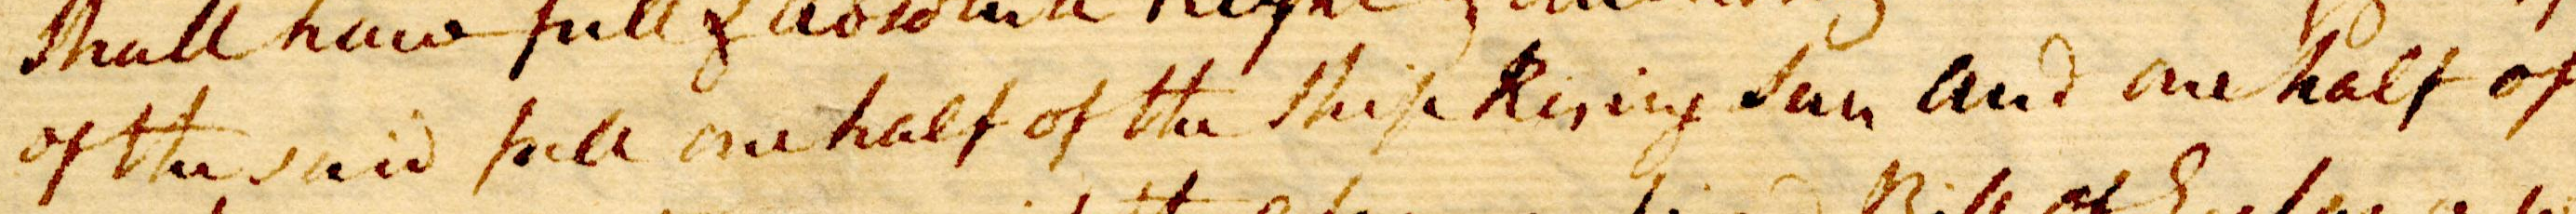of the said full one half of the ships Rising sun and one half of
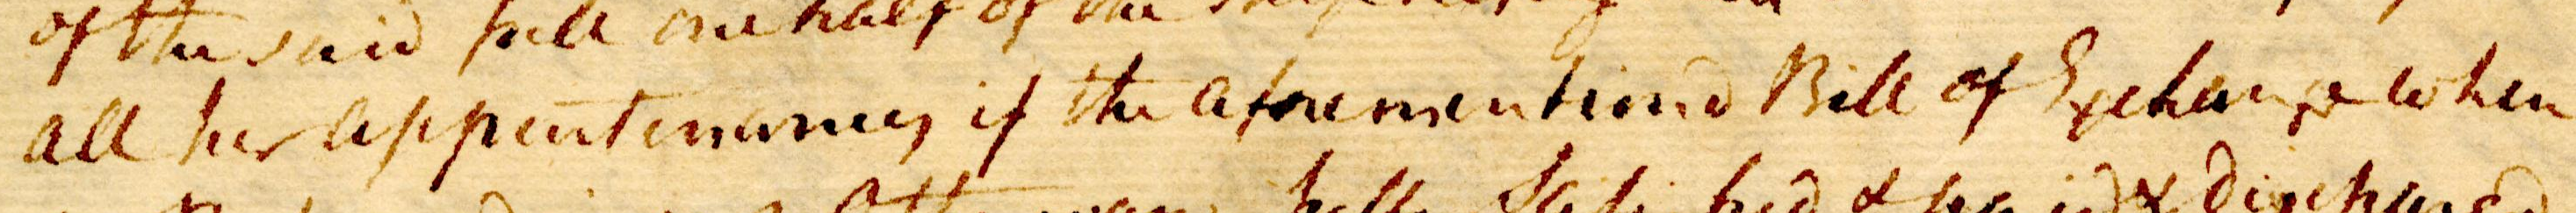all her appurtenances if the aforementioned Bill of sale & when
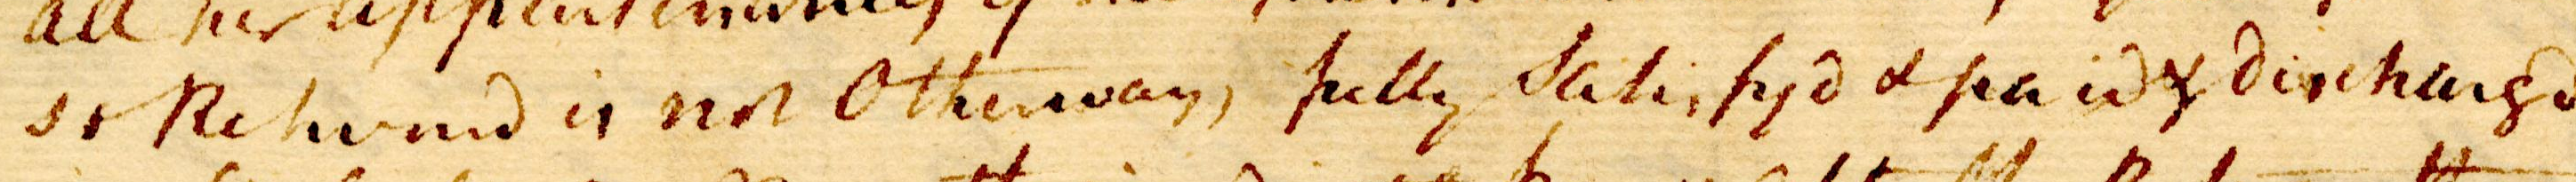so Releived is not Other ways, fully Satisfy'd & paid & discharg'd
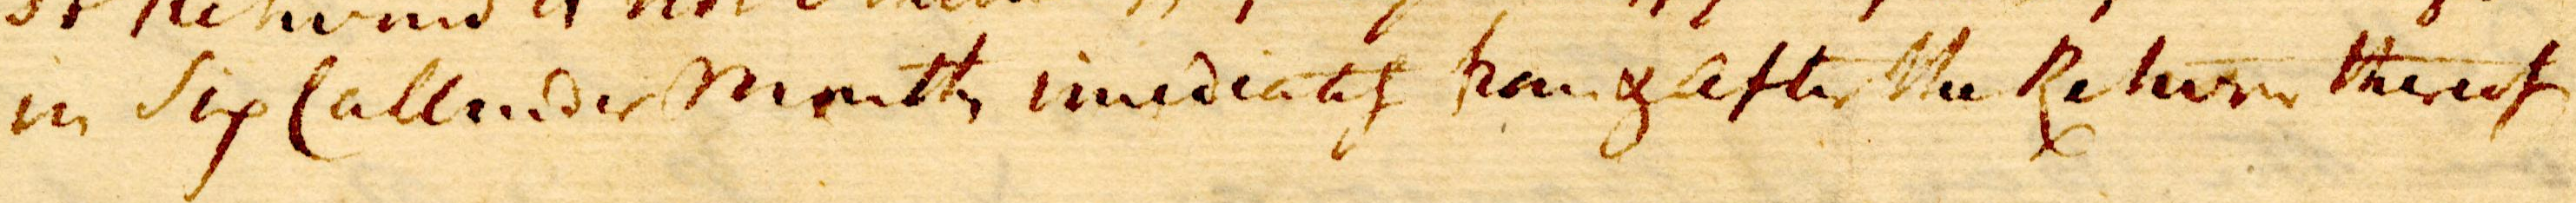in seg Callender Month immediate have & after the Return thereof
